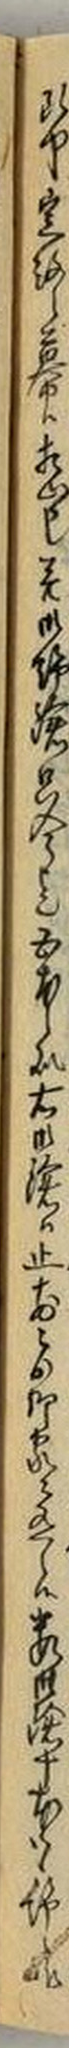頭中定紋之幕ハ相止申候幷御飾鎗只今迄御本之処右御鎗ハ止前々ゟ御家ニ有之候数御鎗十本ツヽ飾候様
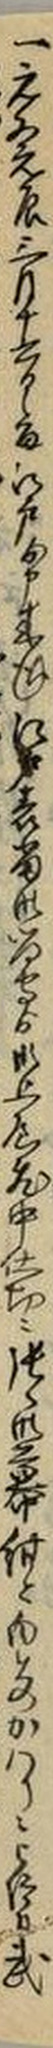一元文元辰三月十六日留江戸ゟ申来趣江戸表当御留守ゟ御上屋敷中仕切ニ張候御幕紺と白とのかハリニ被仰付武
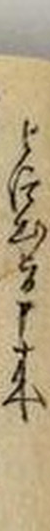被仰出旨申来
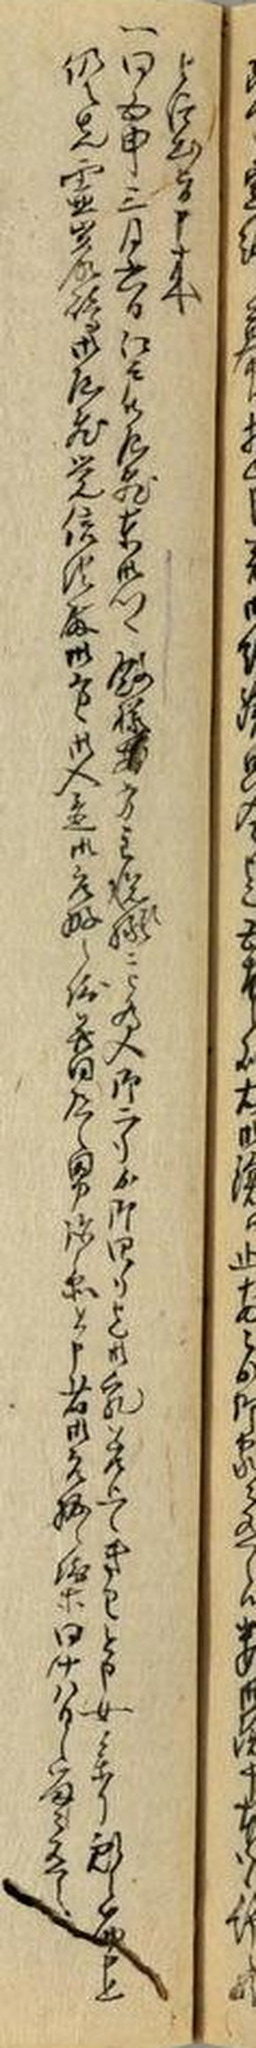一同五申三月六日江戸御屋敷東御門へ殿様前方主税類縁？ニ被為入御ニツゟ御四ツ迄御乳差上候きりと申女参り願之筋申上
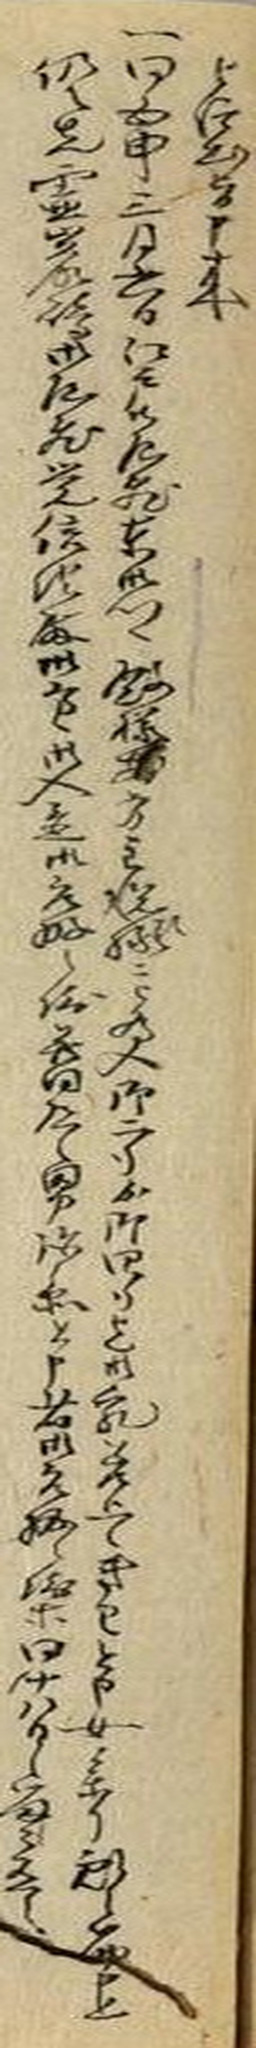仍之先霊岸嶋御屋敷覚信院殿御方へ御入置御取扱之儀幷同道之男弥兵衛と申者御取扱之儀等同十八日之留ニ有之
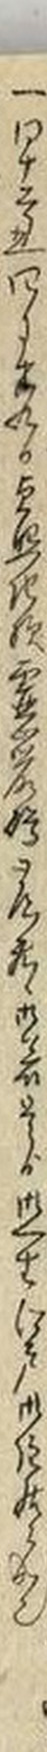一同十二丑四月廿九日貞照院様霊岸嶋御屋敷へ御着是ゟ御一生江戸御住居被成候也
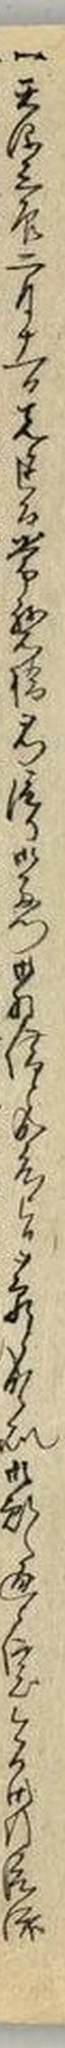一天保三辰二月十一日先達而常盤橋御門渡り御多門御拝借被成度旨御願被成候処御願之通被仰出今日御門渡済
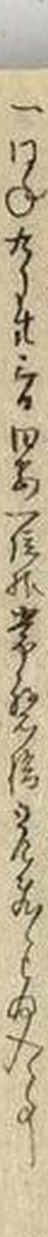一同年九月廿三日田安一位様常盤橋御屋敷へ被為入候事
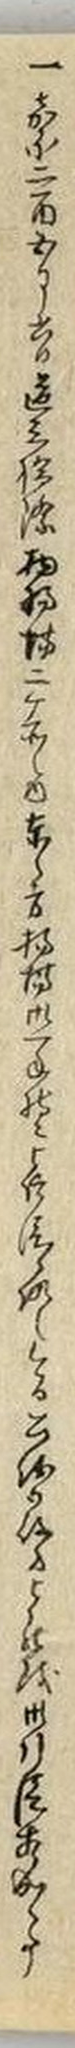一嘉永二酉五月六日道立橋際物揚場二ケ所之内東之方揚場御一手持ニ被仰渡候仍之今日公儀御役方被罷越御引渡相成候事
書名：御国他国諸事之部
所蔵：福井県文書館 Fukui Prefectural Archives
